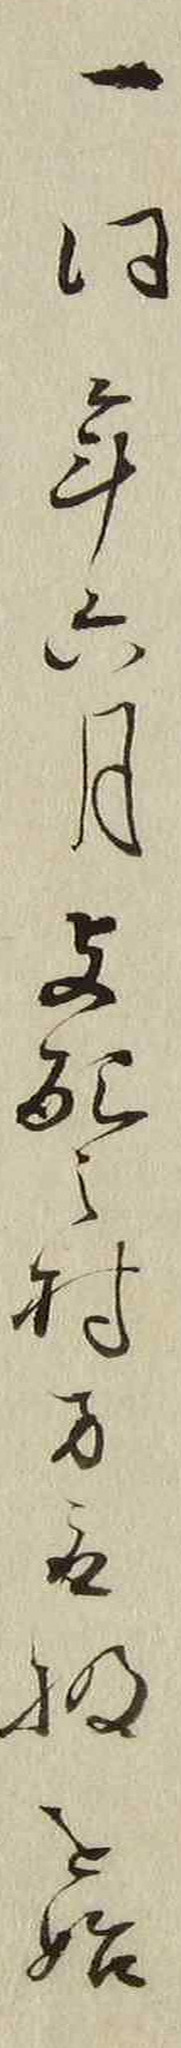一同年六月支配之村方取扱を始
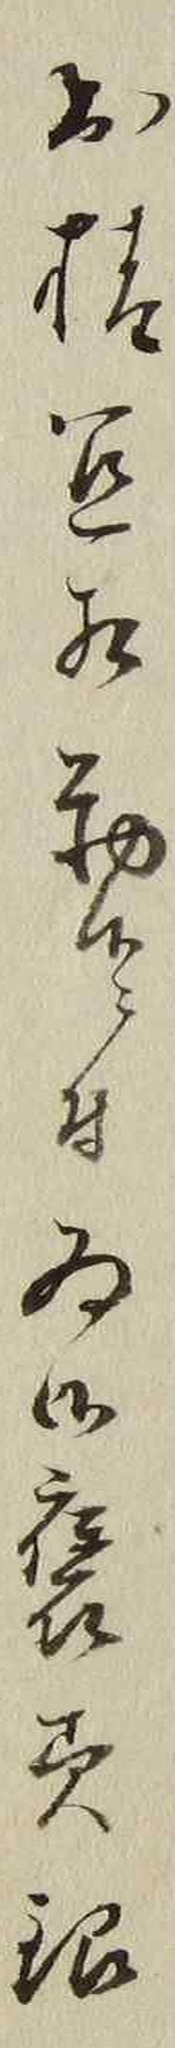出精宜相勤候ニ付為御褒美銀
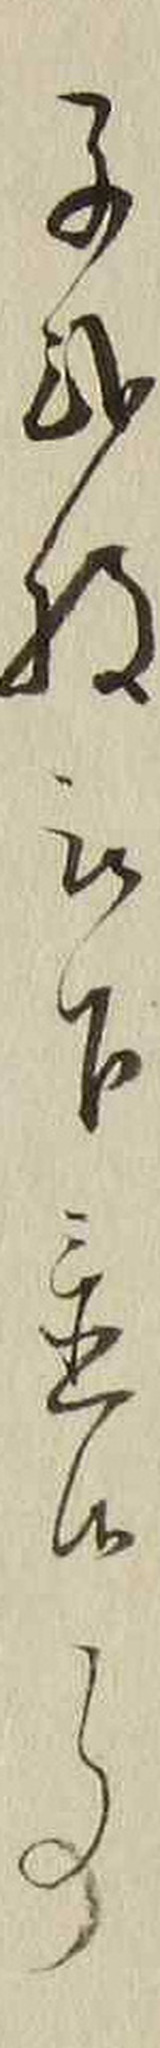子弐枚被下置候事
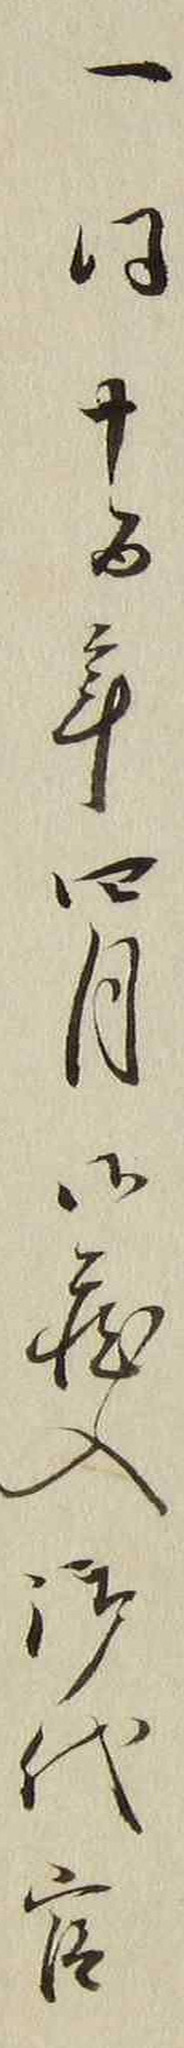一同十酉年四月御蔵入御代官
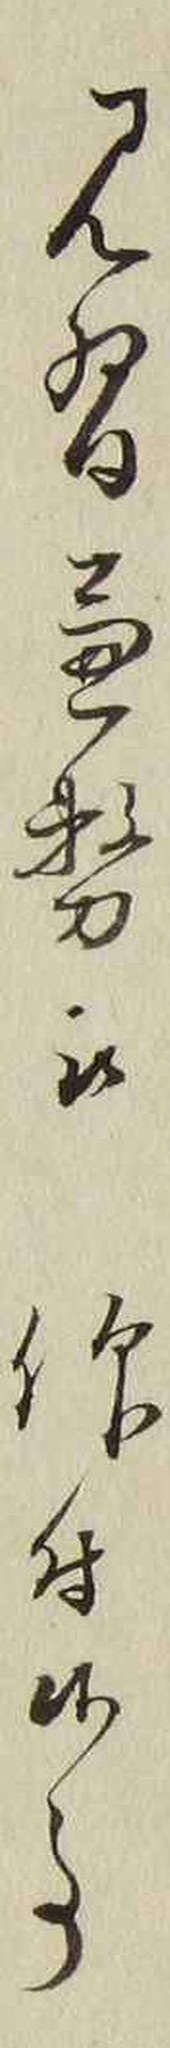見習兼務被仰付候事
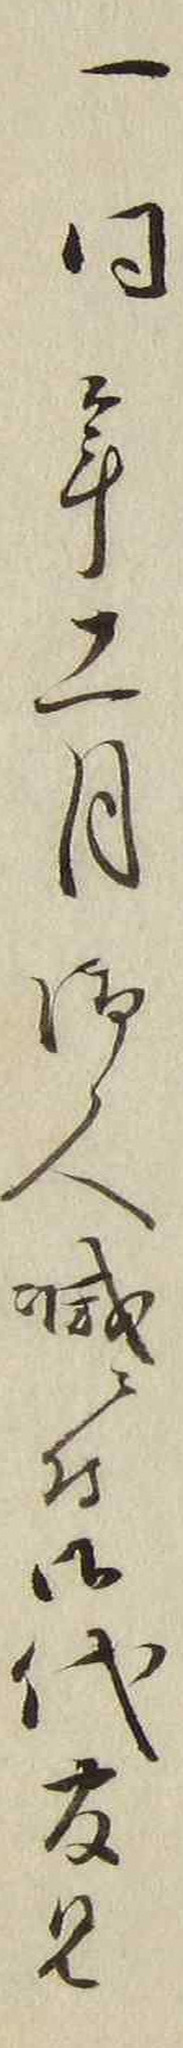一同年十一月御人減ニ付御代官見
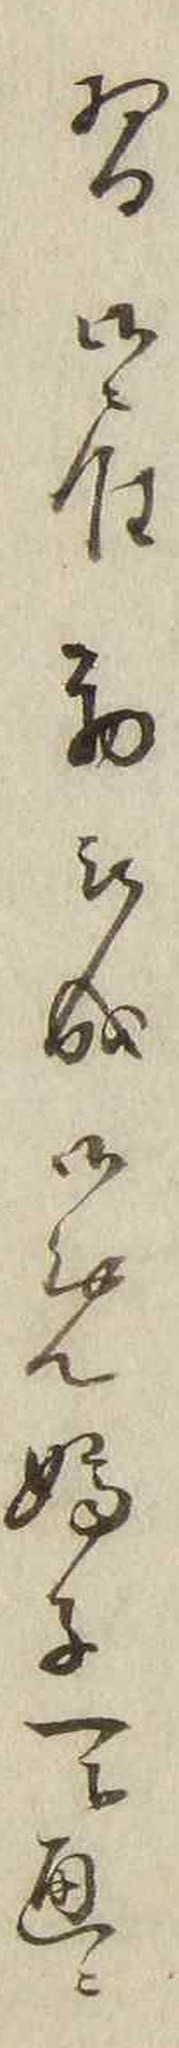習御雇勤被成御免嫡子一ト通ニ

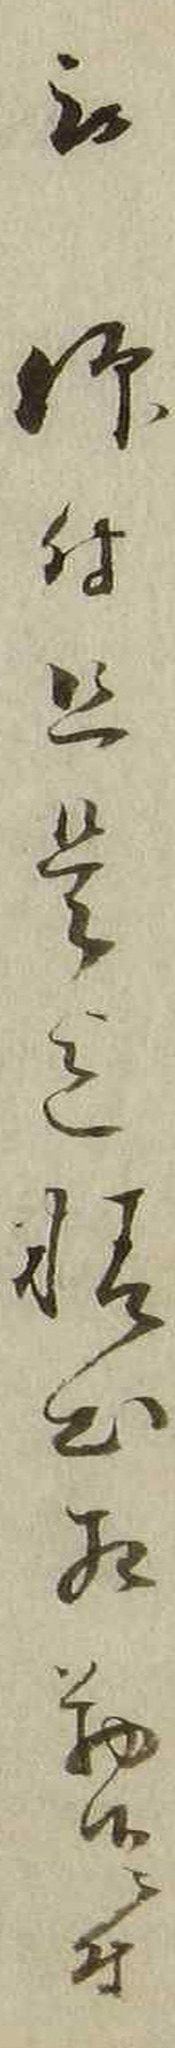被仰付且是迄精出相勤候ニ付
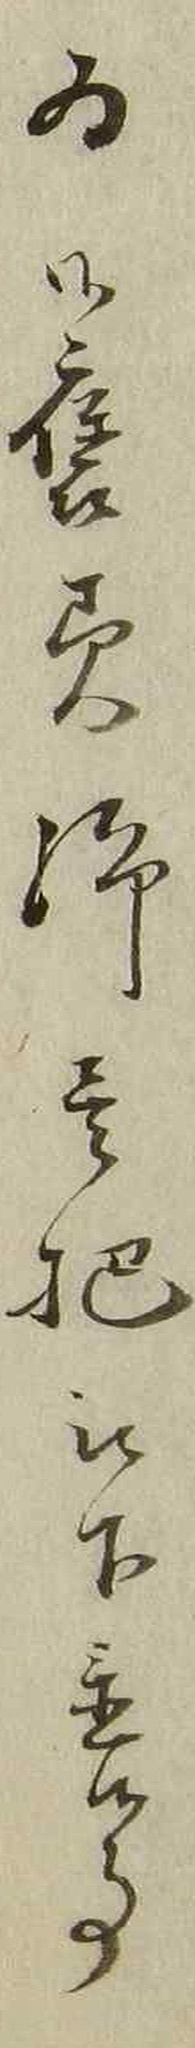為御褒美綿壱把被下置候事
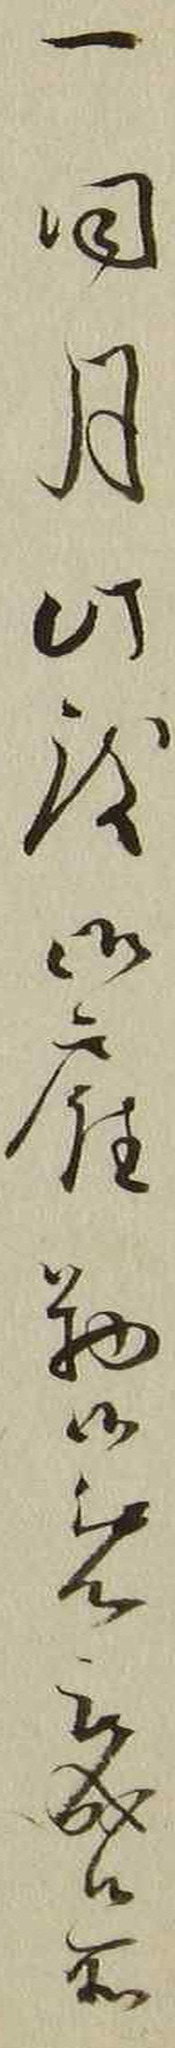一同月此度御雇勤御免被成候所
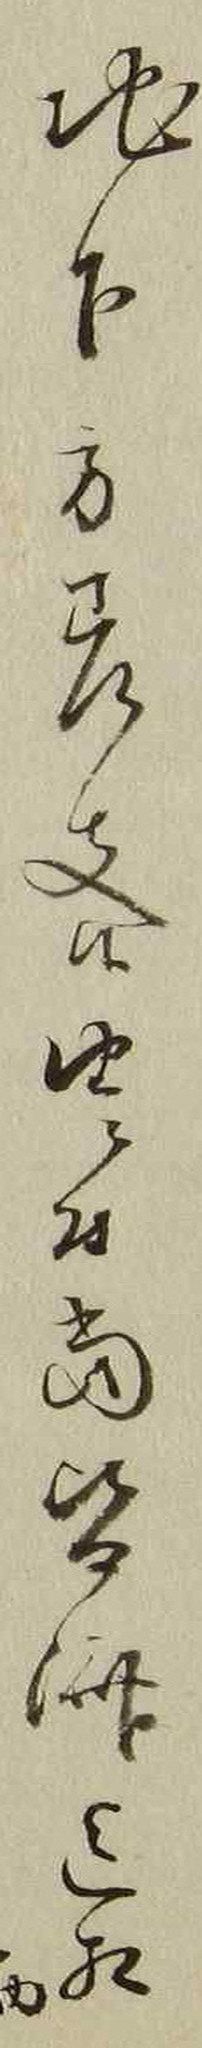地下方差支候由ニ付当皆済迄相勤
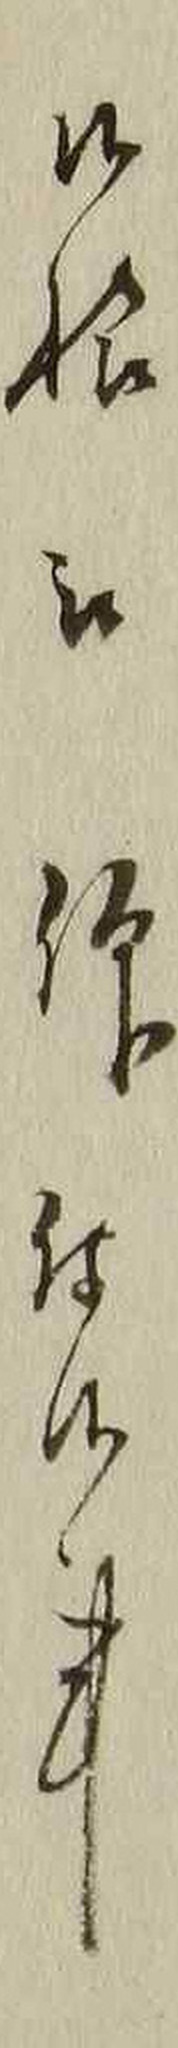候様被仰付候事
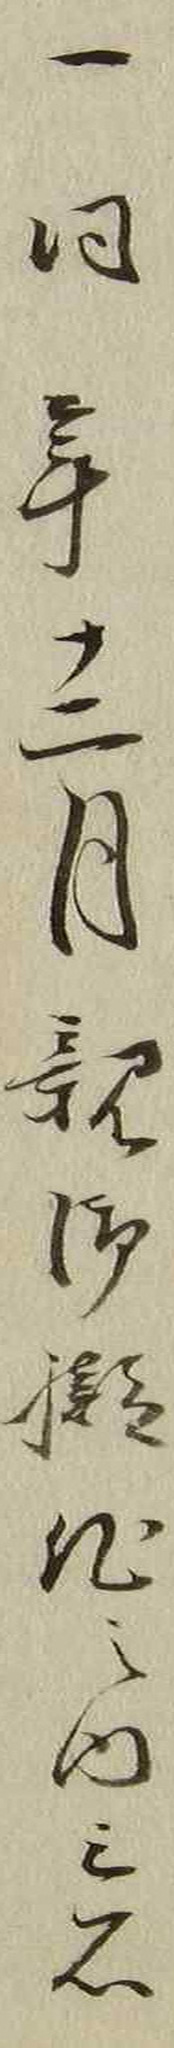一同年十二月親御擬作之内三石
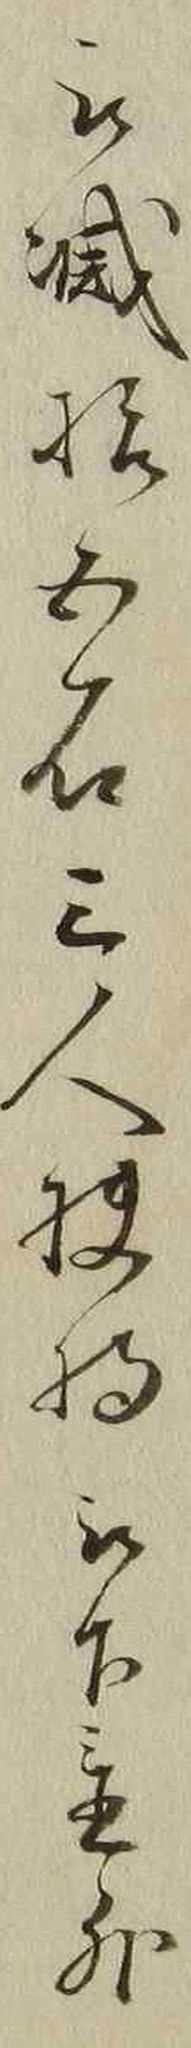被減拾五石三人扶持被下置外
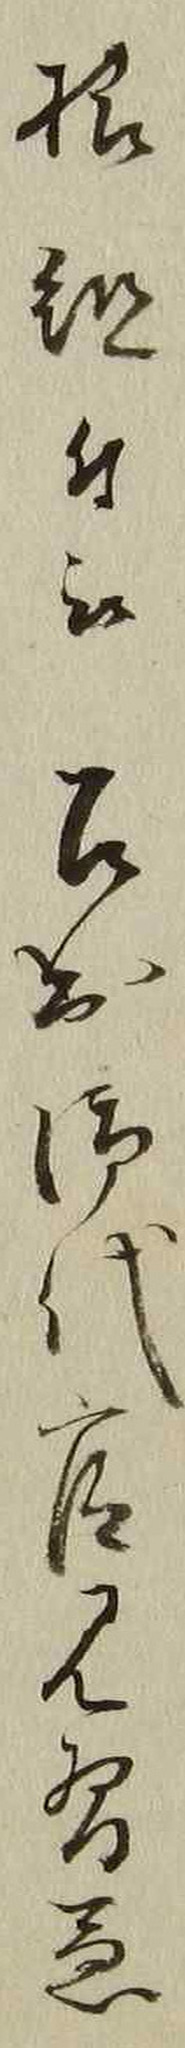様組付被仰出御代官見習兼
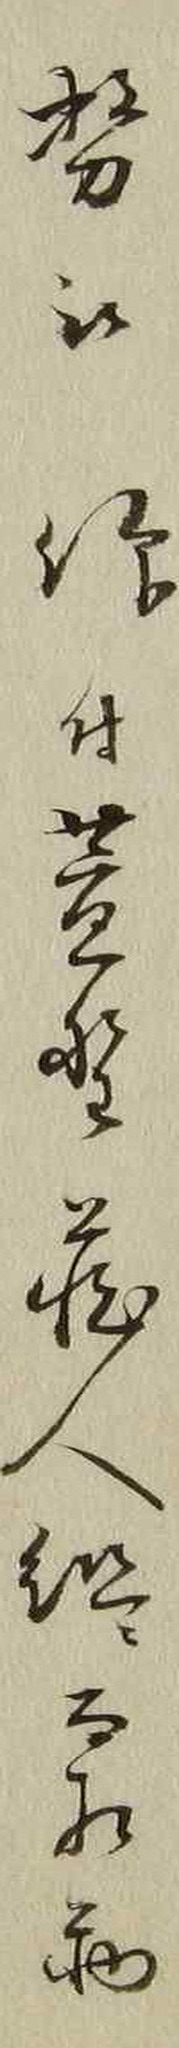務被仰付萱野蔵人組ニ而相勤
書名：諸士系譜　巻之129　た之部5
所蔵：会津若松市立会津図書館
